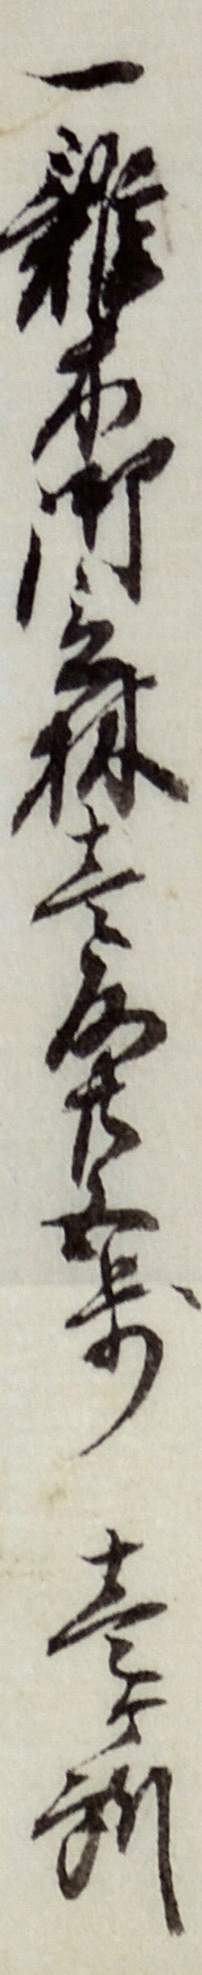一雑木御立林壱反廿五歩壱ヶ所
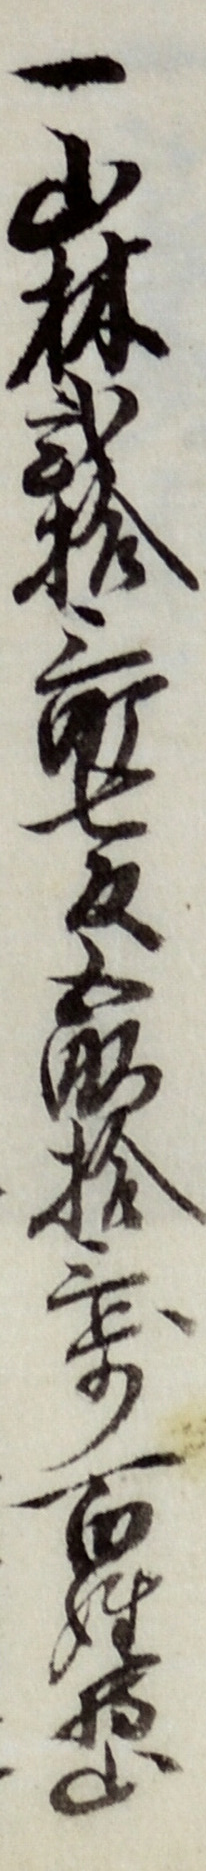一山林弐拾三町七反五畝拾三歩百姓持山
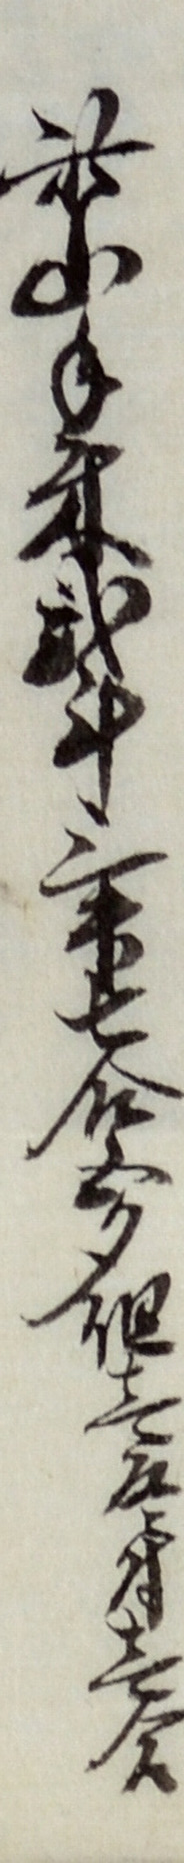此山手米弐斗三升七合五夕但壱反ニ付壱合
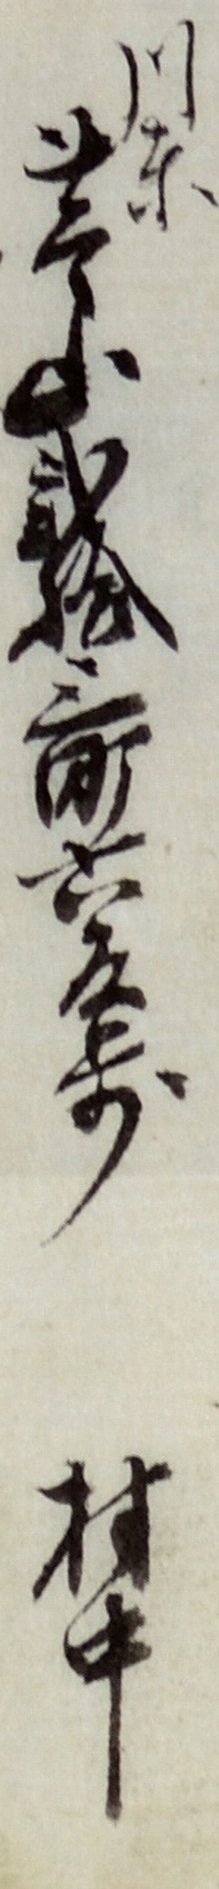芝山弐拾三町六反歩村中
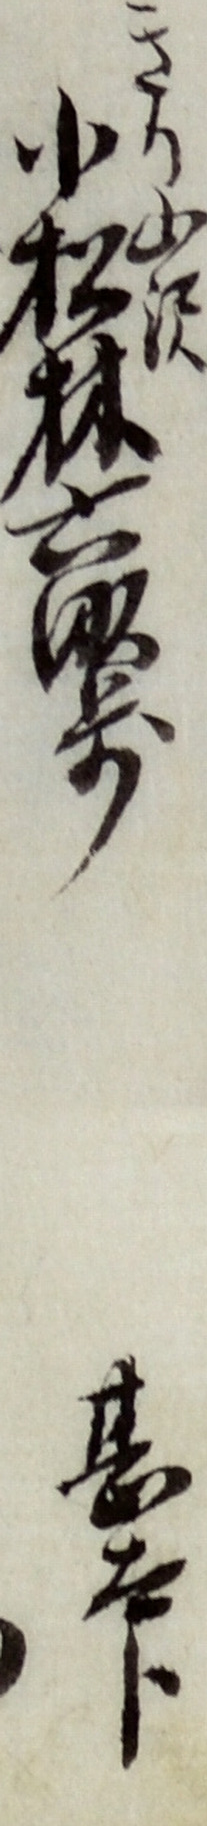小松林六畝歩甚太郎
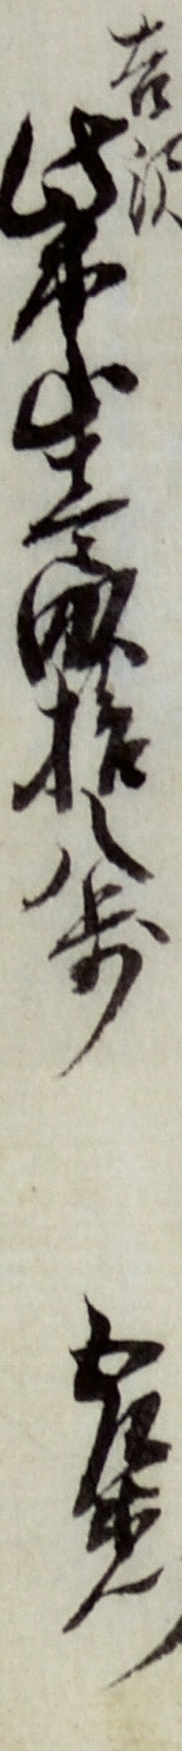柴山壱畝拾八歩五左衛門

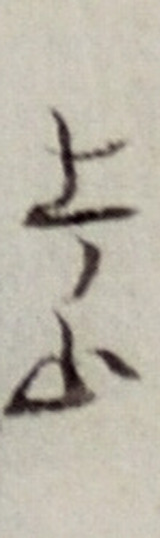上ノ山
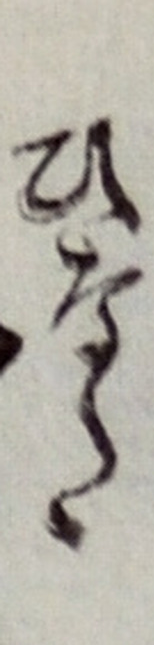ひなた
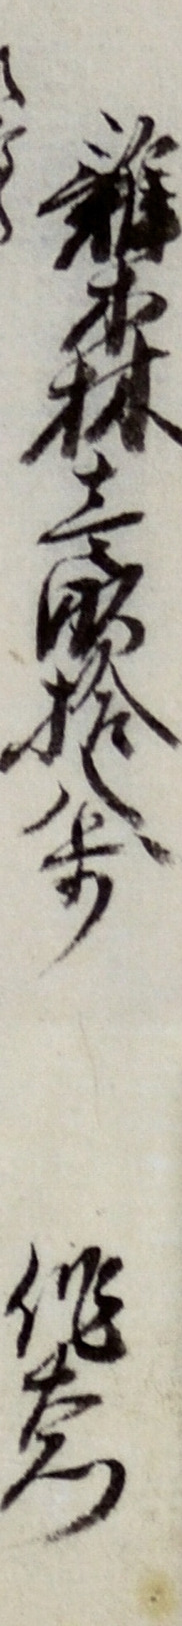雑木林壱畝拾八歩作右衛門
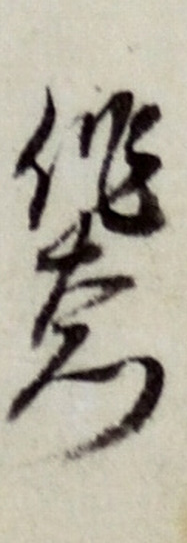三右衛門
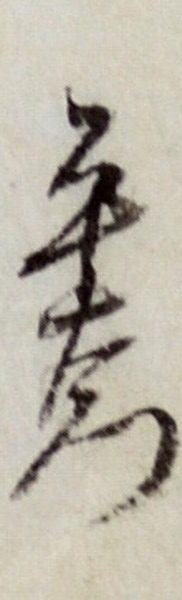三右衛門
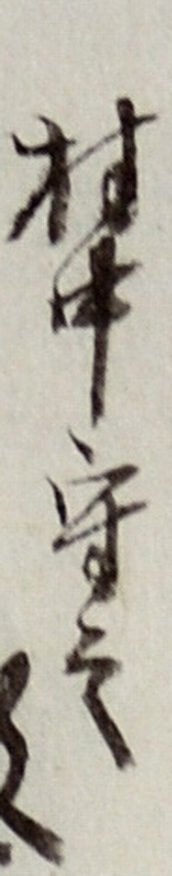村中守之
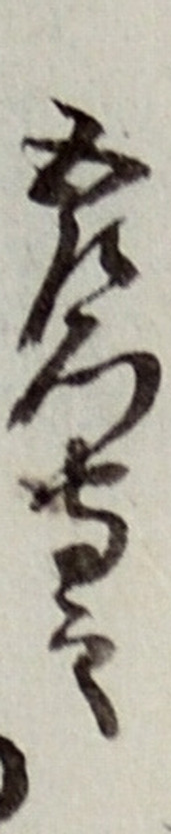五左衛門守之
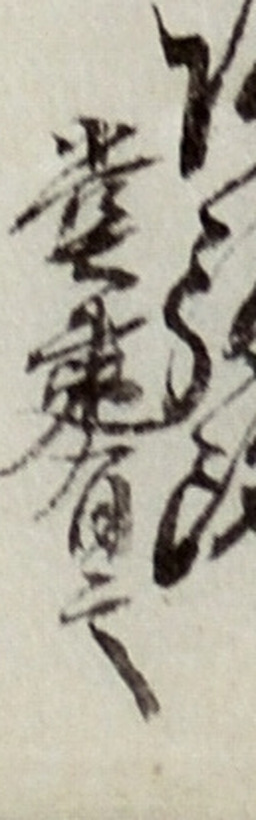堂建有之
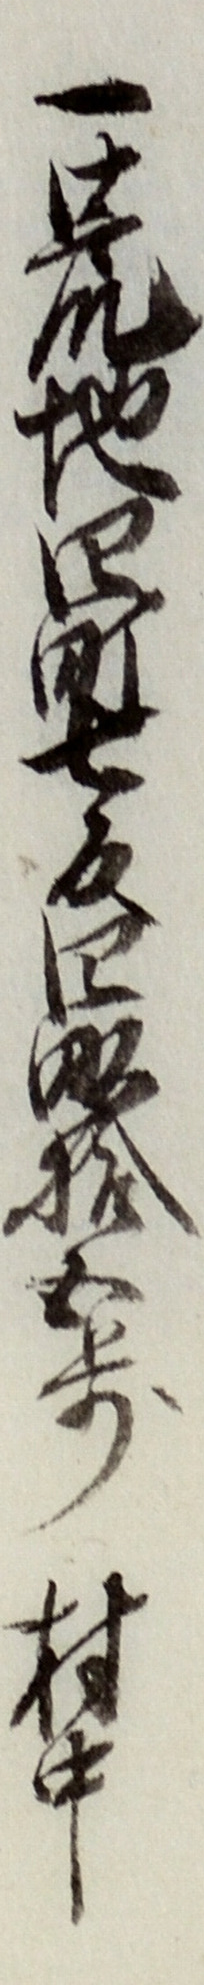一荒地四町七反四畝拾五歩村中
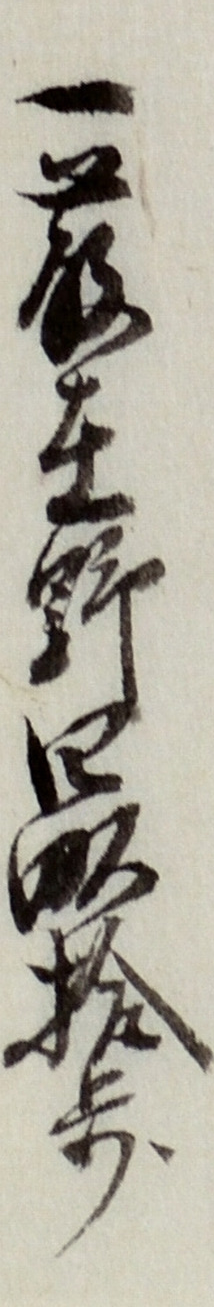一散在野四畝拾歩
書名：御領分中山林社地手控
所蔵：伊那市立高遠町図書館・合同会社AMANE
